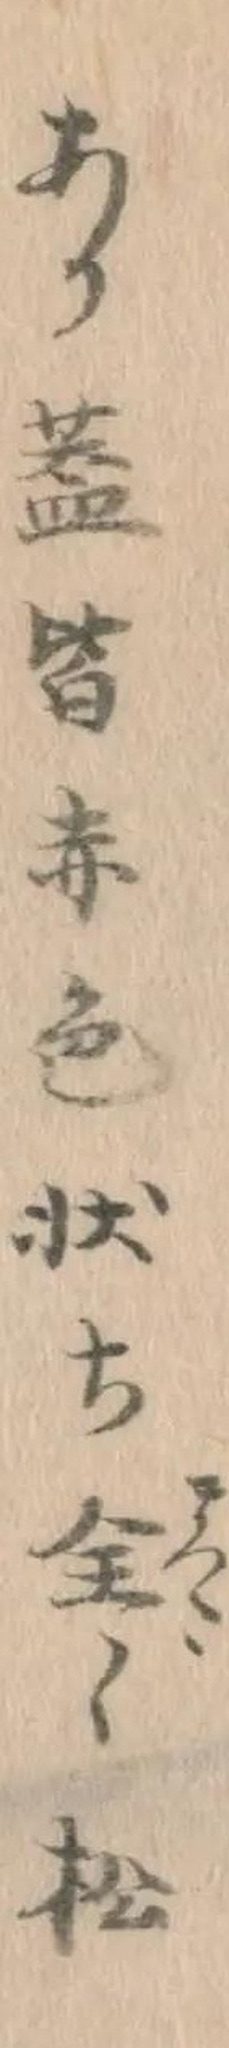あり蓋皆赤色状ち全く松
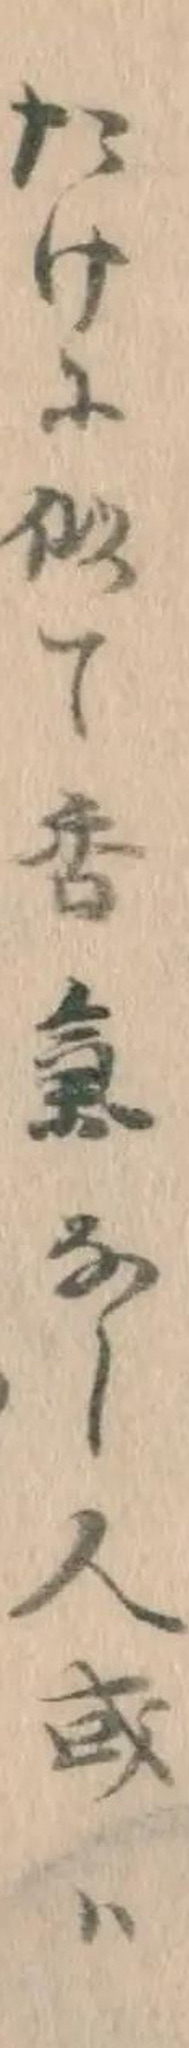たけに似て香気なし人或は
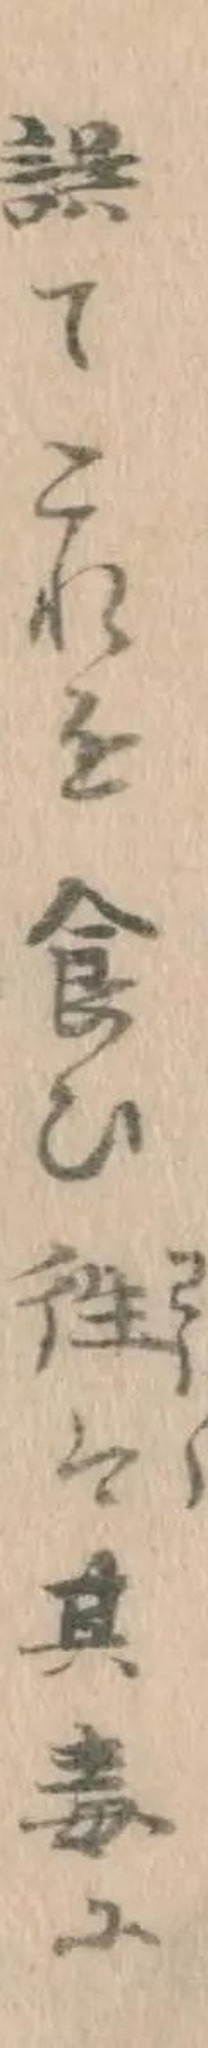誤てこれを食ひ往々其毒に
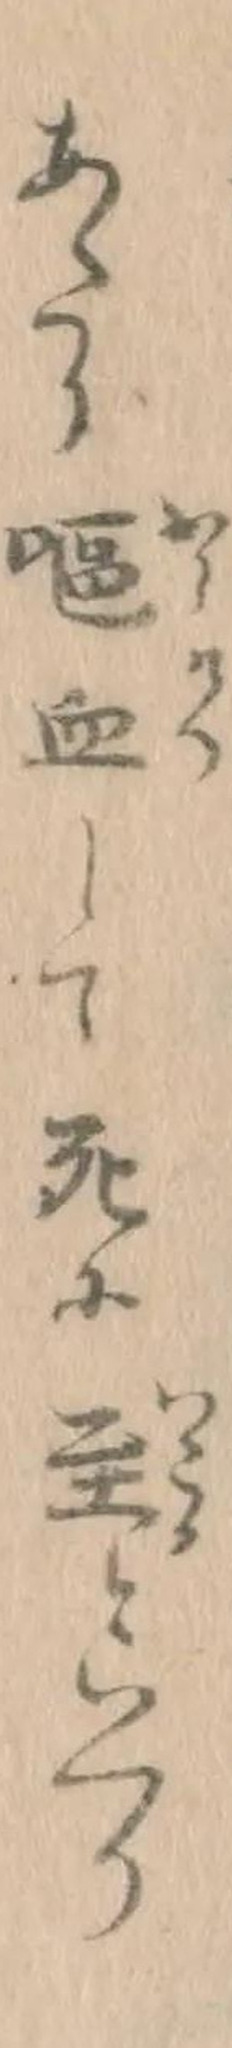あたり嘔血して死に至といへり

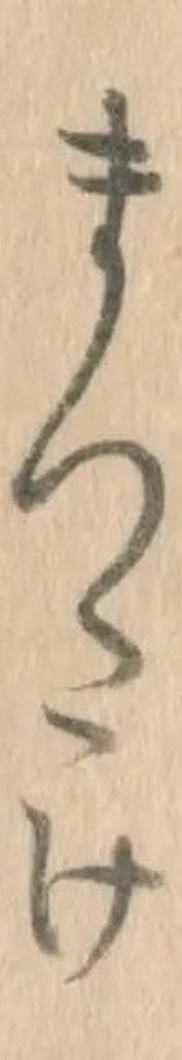まつたけ
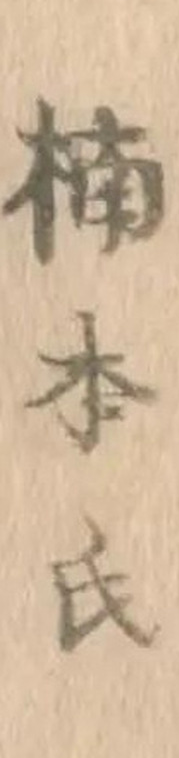楠本氏
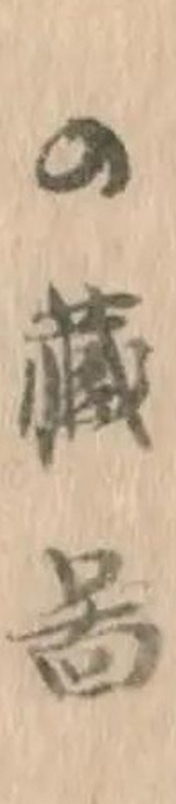の蔵図
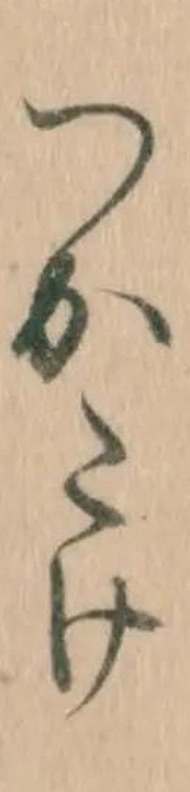つかたけ
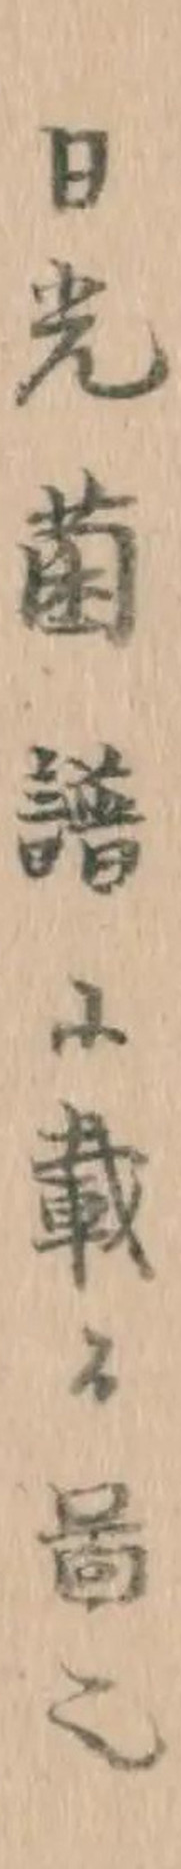日光菌譜に載る図也
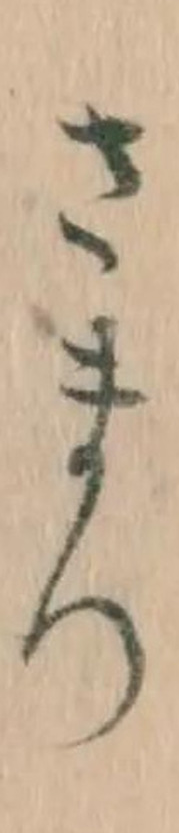さまつ
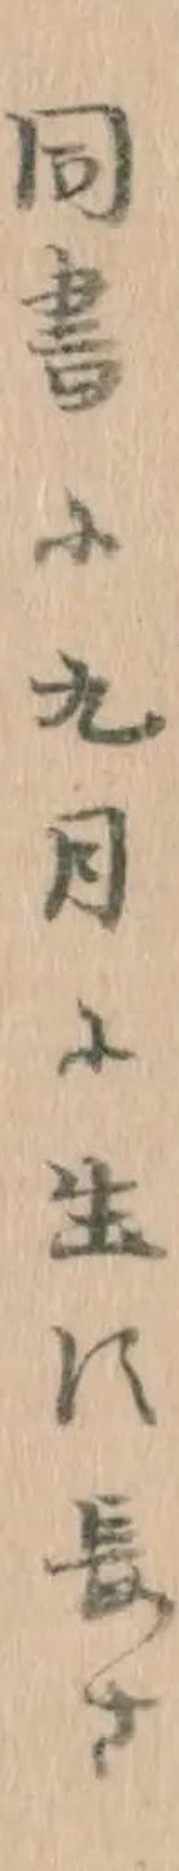同書に九月に生す長さ
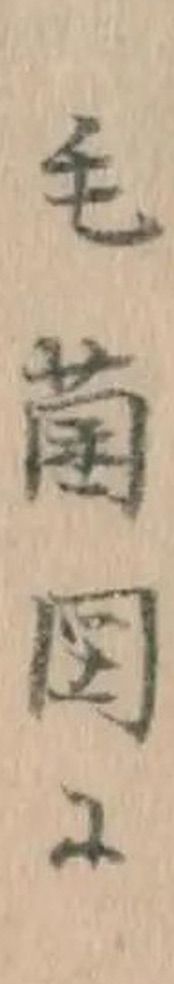毛菌図に
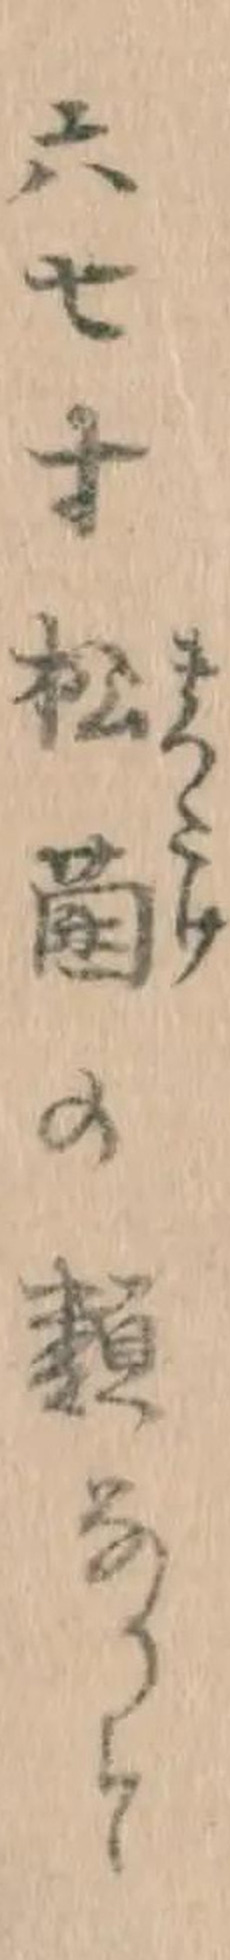六七寸松菌の類なりと
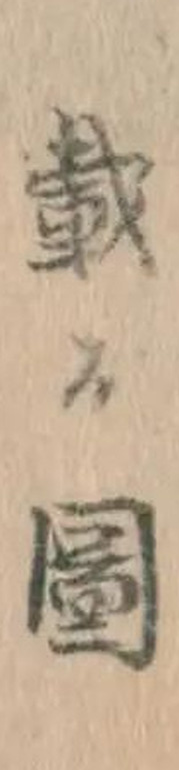載る図
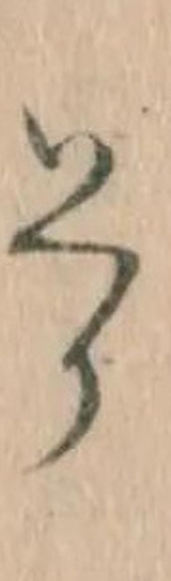いへり

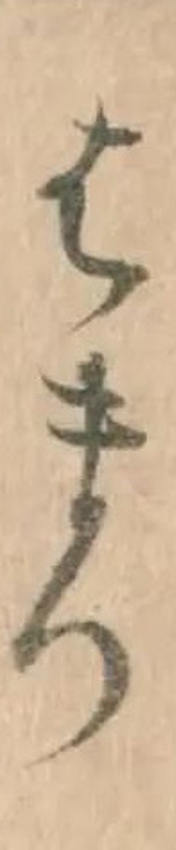はまつ
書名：本草図譜. 巻55-57
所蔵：国立国会図書館 National Diet Library, JAPAN
